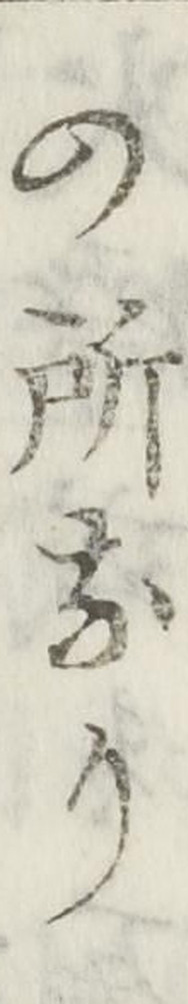の所なり
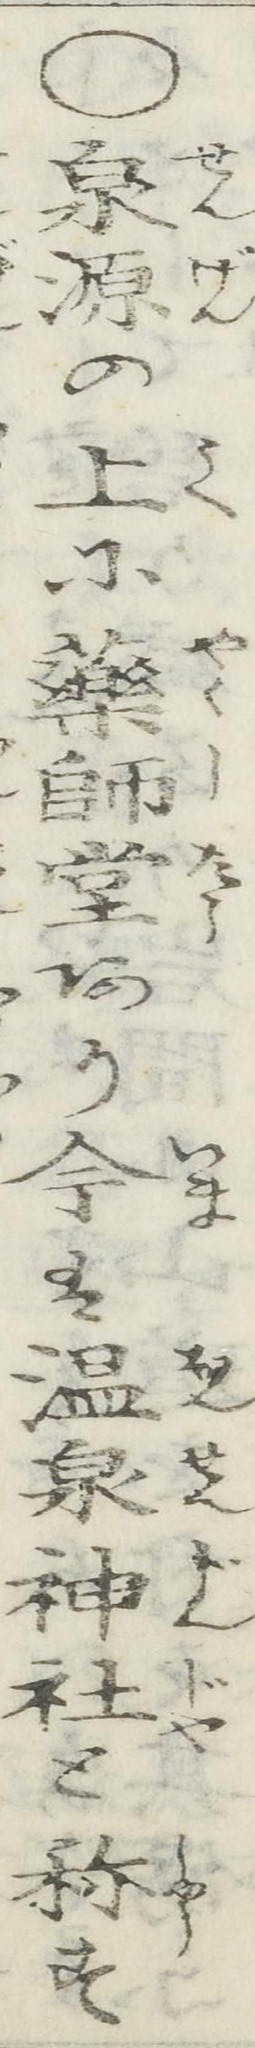〇泉源の上に薬師堂あり今は温泉神社と称す
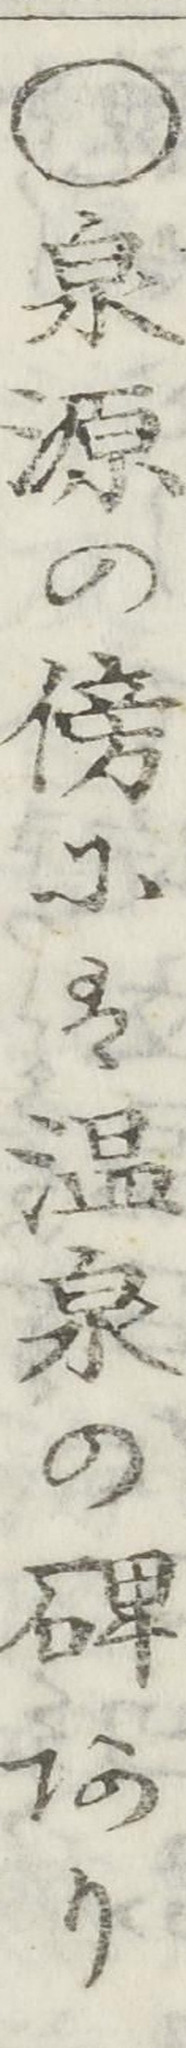〇泉源の傍には温泉の碑あり
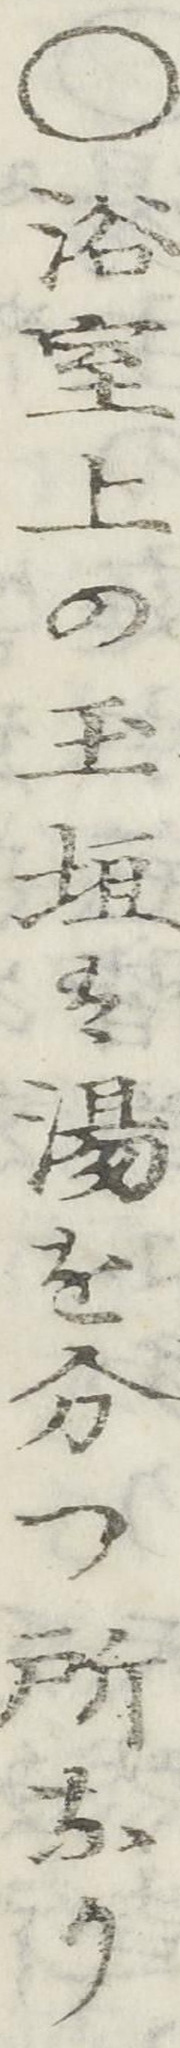〇浴室上の玉垣は湯を分つ所なり

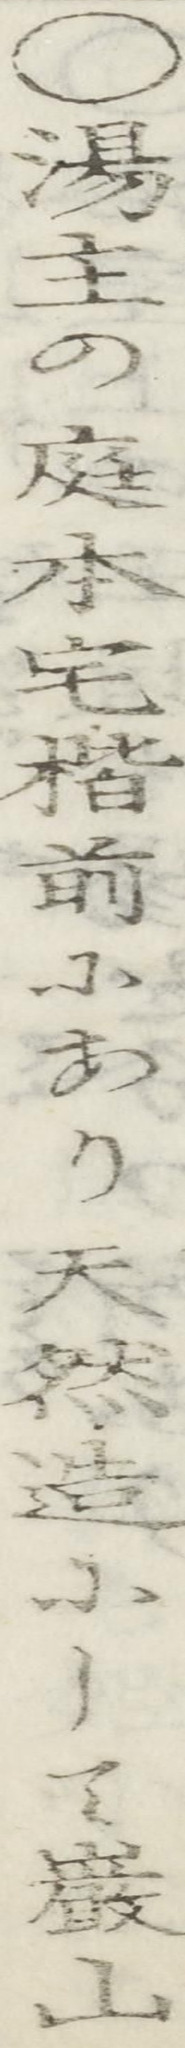〇湯主の庭本宅楷前にあり天然造にして巌山
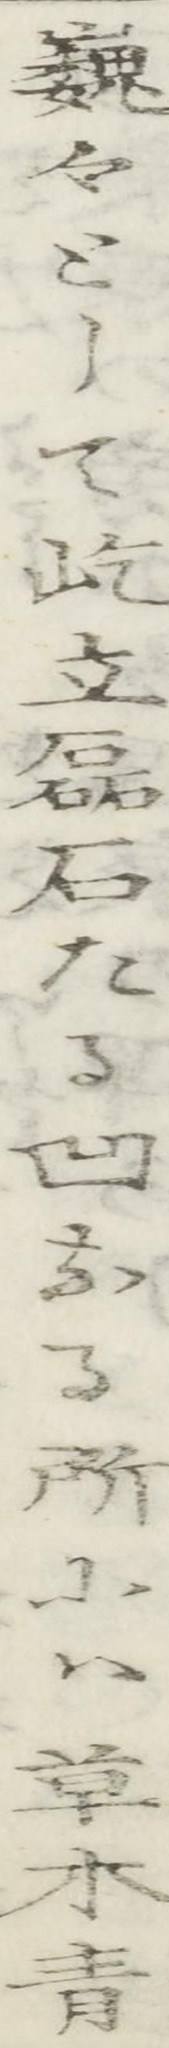巍々として屹立磊石たる凹なる所には草木青
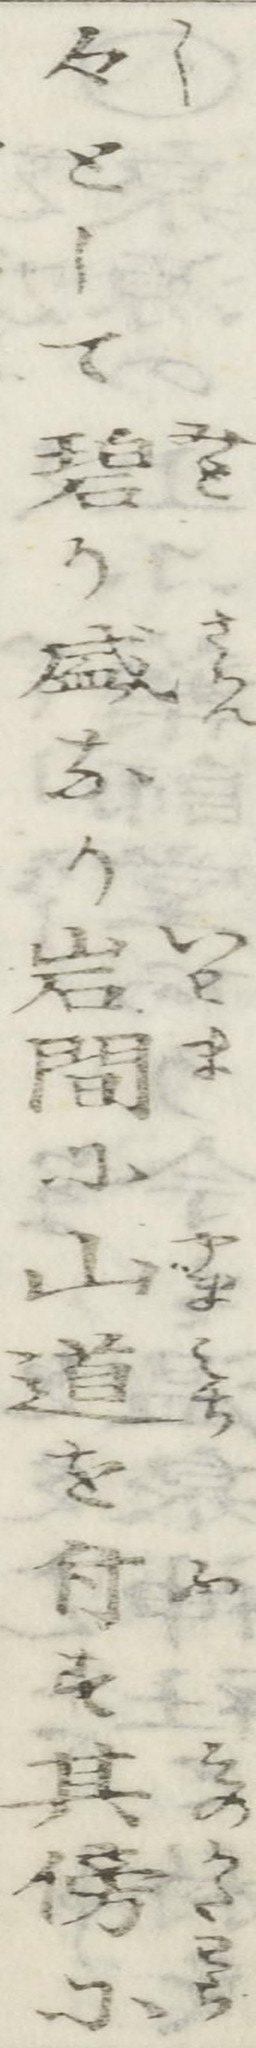々として碧り盛なり岩間に山道を付す其傍に
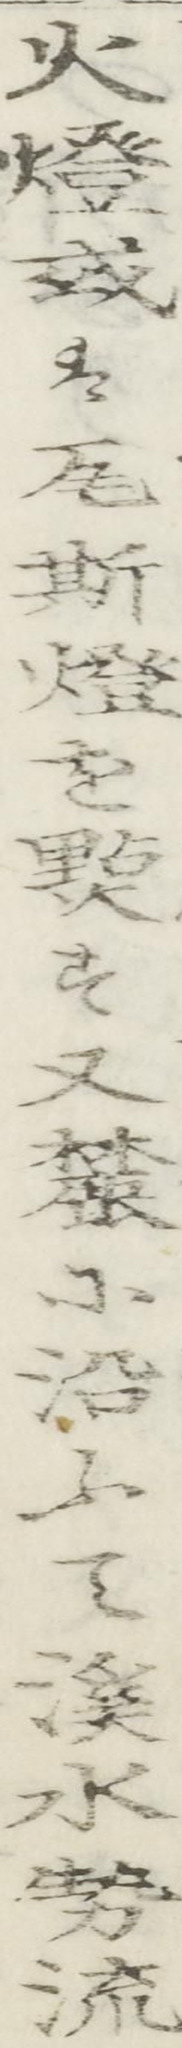火灯或は瓦斯灯を点す又麓に沿ふて渓水勢流
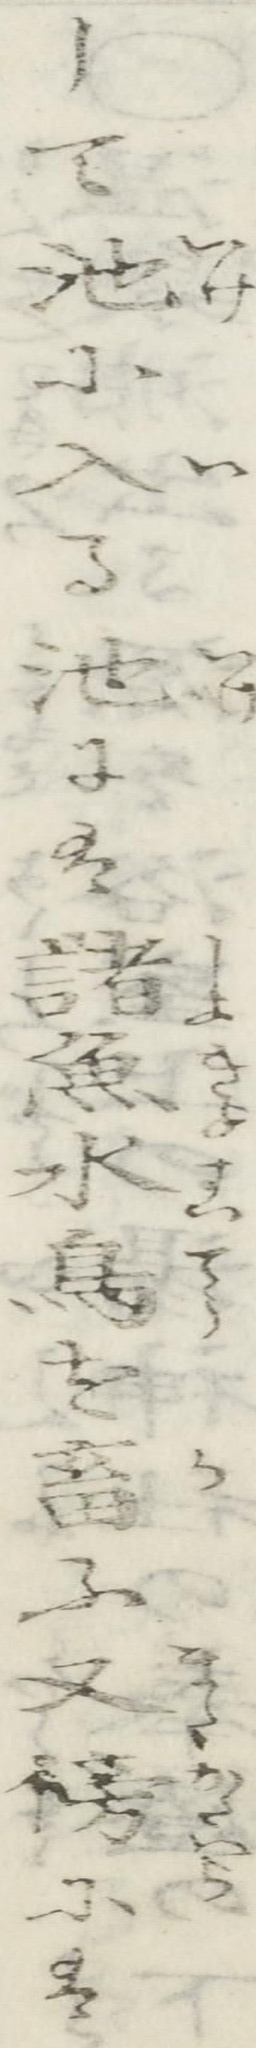して池に入る池には諸魚水鳥を畜ふ又傍にも
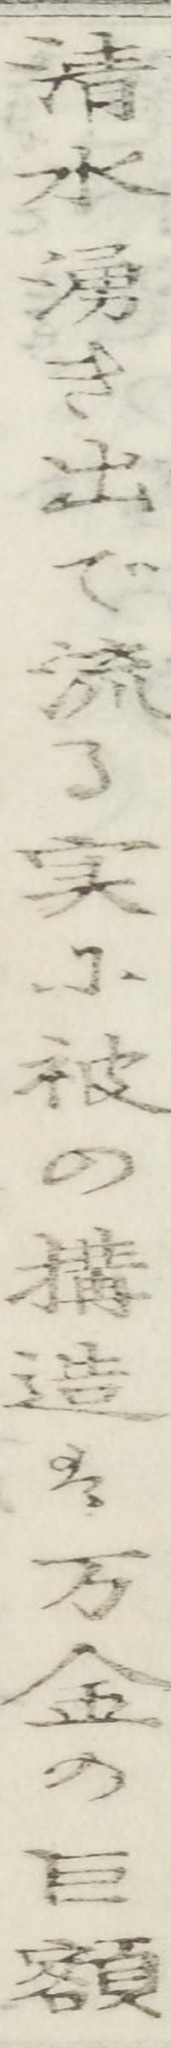清水湧き出で流る実に被の構造は万金の巨額
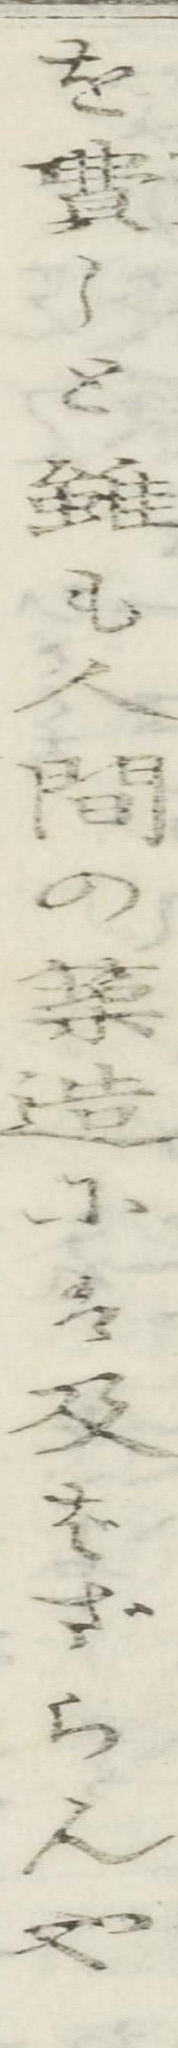を費しと雖も人間の築造すは及ばざらんや
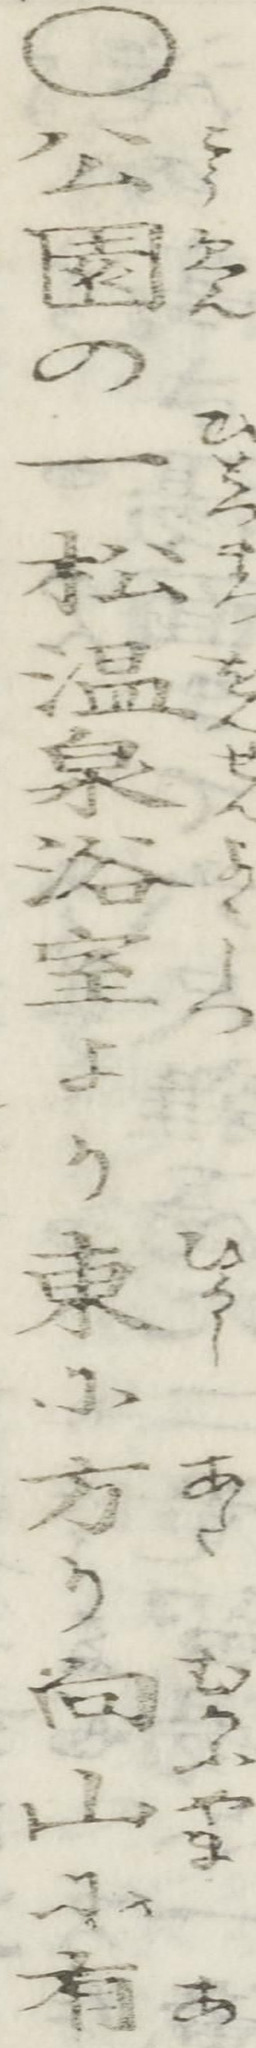〇公園の一松温泉浴室より東に方り向山に有
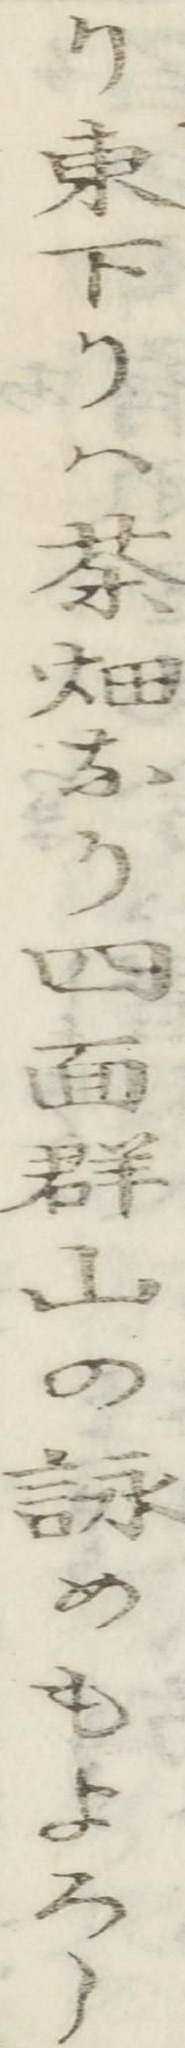り東下りは茶畑なり四面群山の詠めもよろし
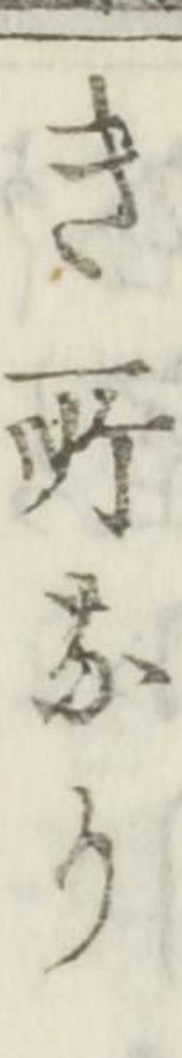き所なり
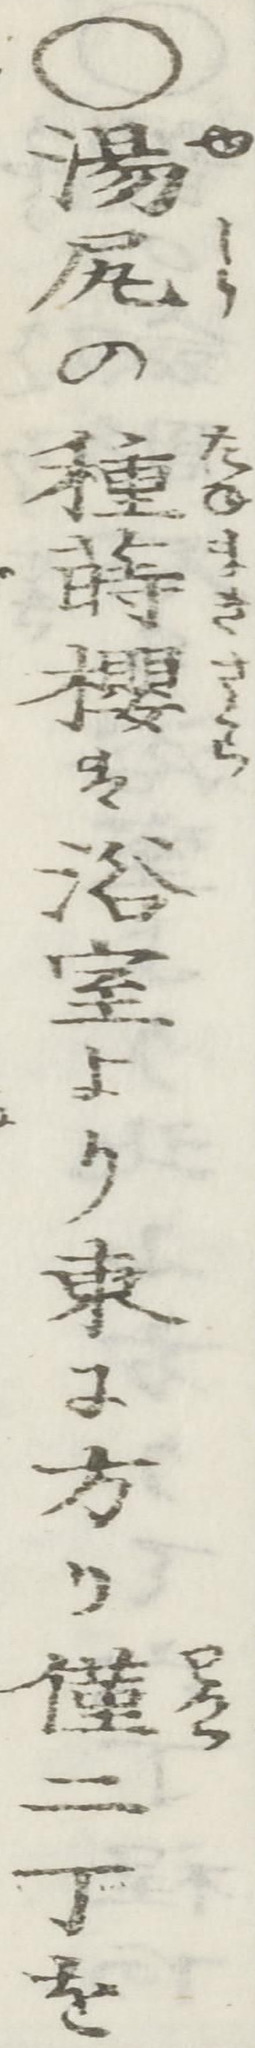〇湯尻の種蒔桜は浴室より東に方り僅二丁を
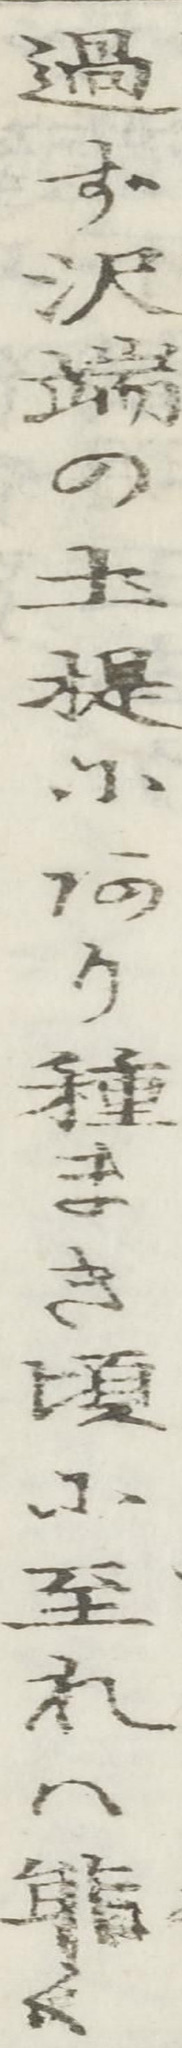過ず沢端の土提にあり種まき頃に至れは能く
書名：鎌先温泉由來記
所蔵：東京大学地震研究所図書室 Earthquake Research Institute Library, The University of Tokyo, JAPAN
